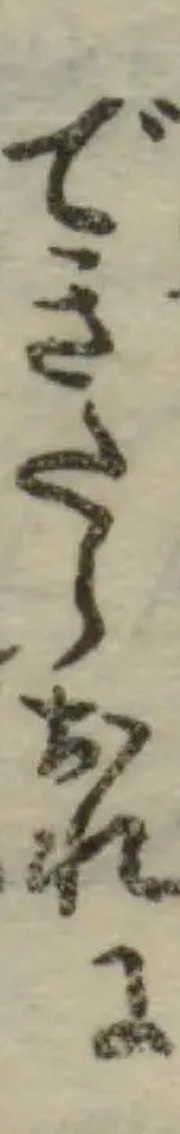できたらおれに
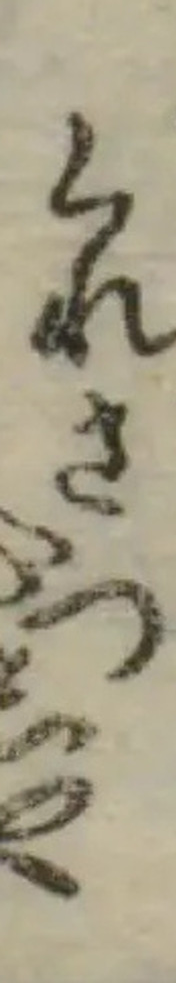くれさつしや
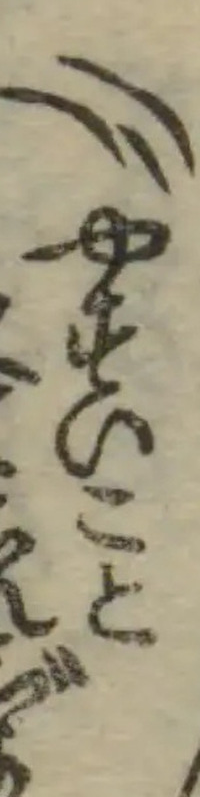やすいこと
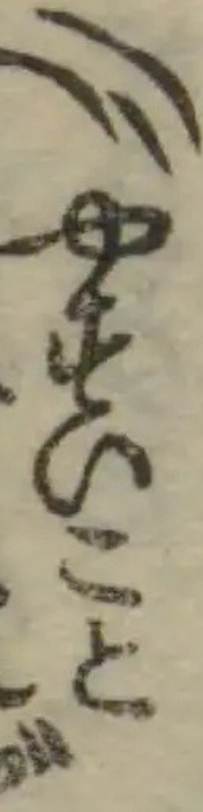やすいこと
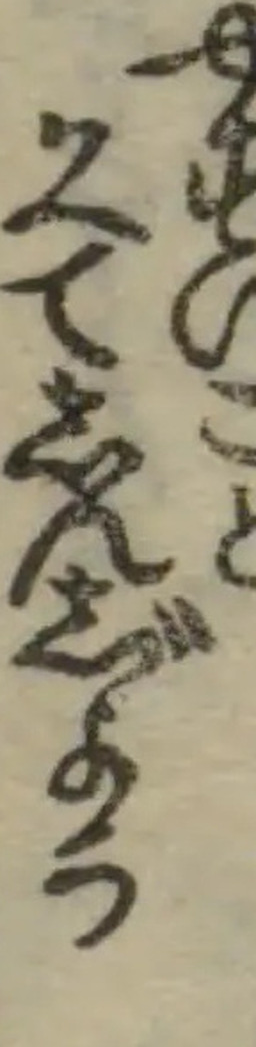うへてしんじよう

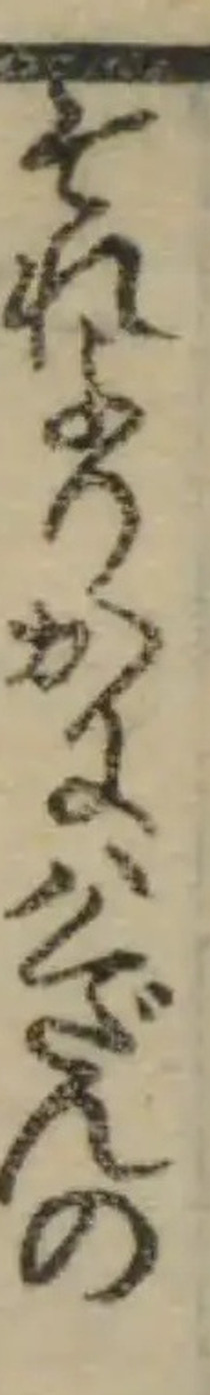それよりかにはくだんの
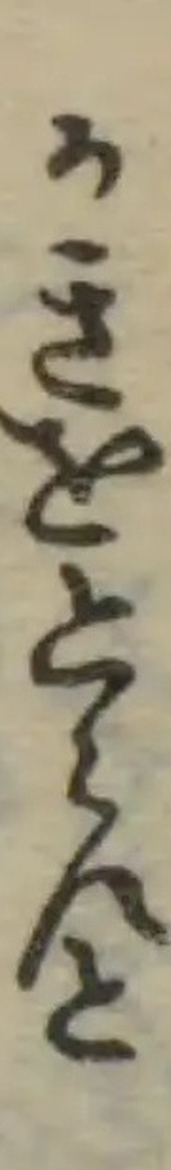かきをとらんと
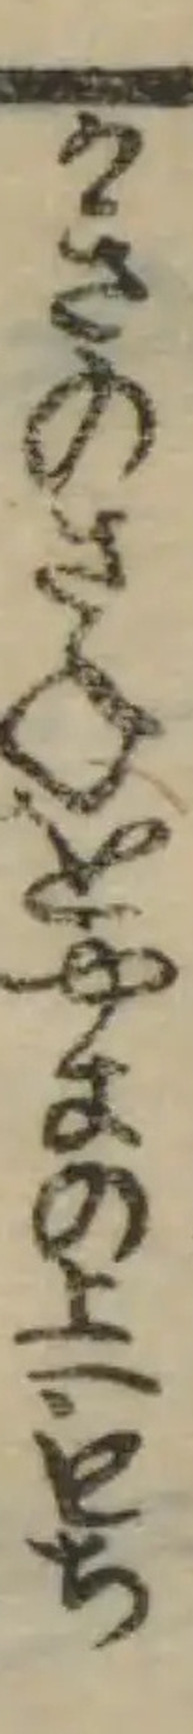かきのさねをやまの上へもち
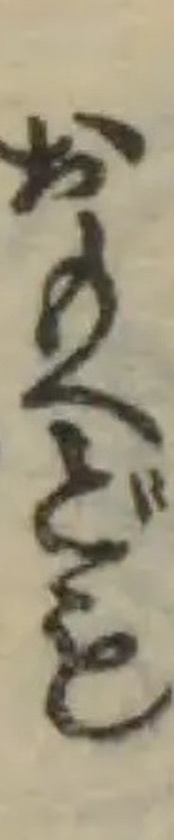おもへども
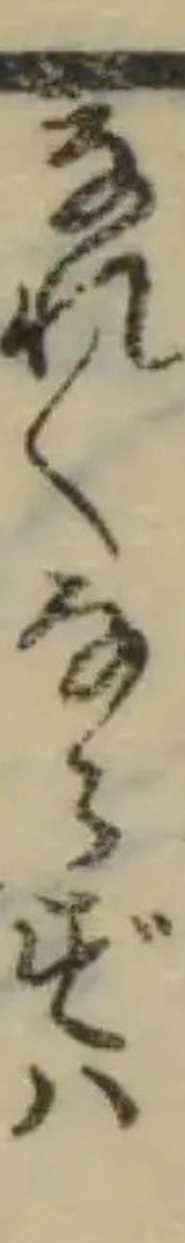なれ〳〵ならずは
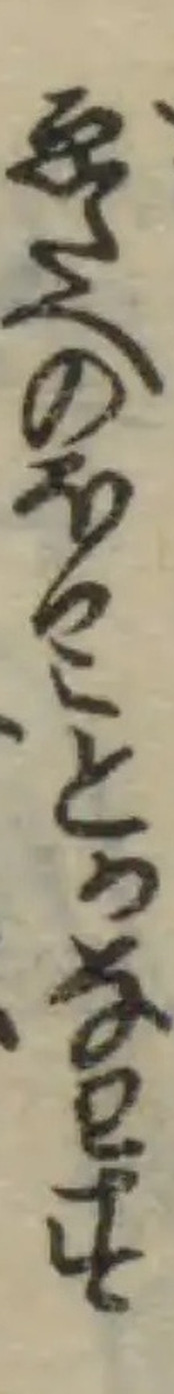ゑたへのほることかなわす
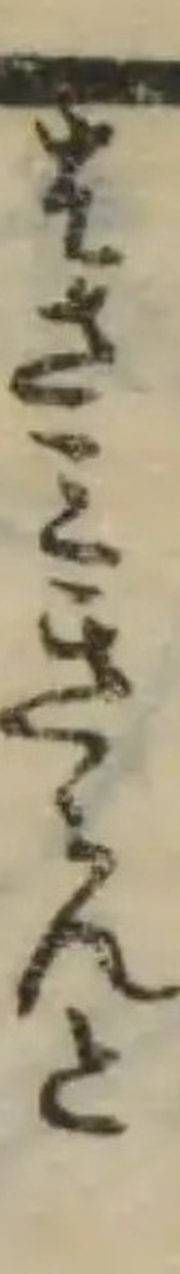はさみきらんと
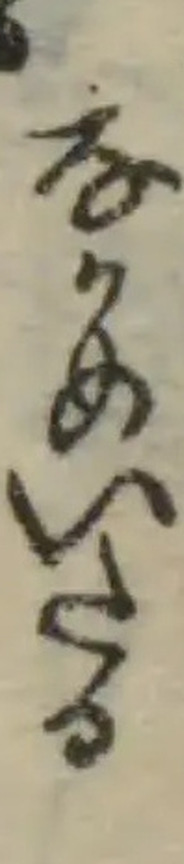なかめいたる
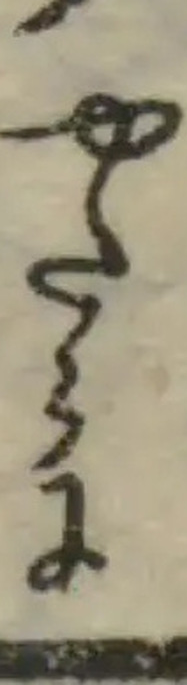やたらに
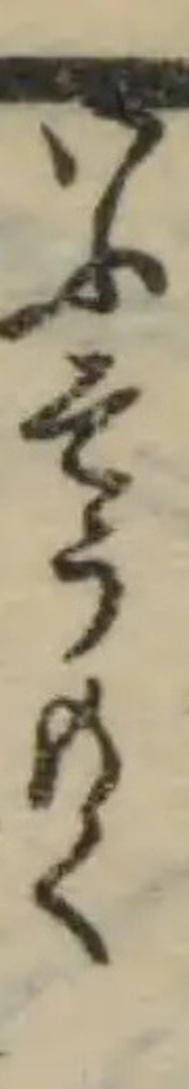いふそうもく
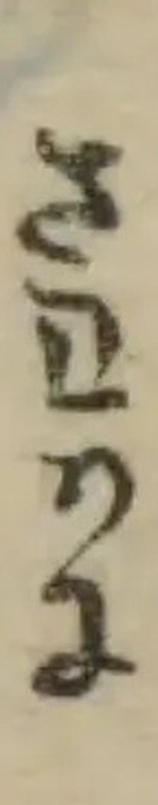さわかに
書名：さるかに合戦
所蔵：国立国会図書館 National Diet Library, JAPAN
